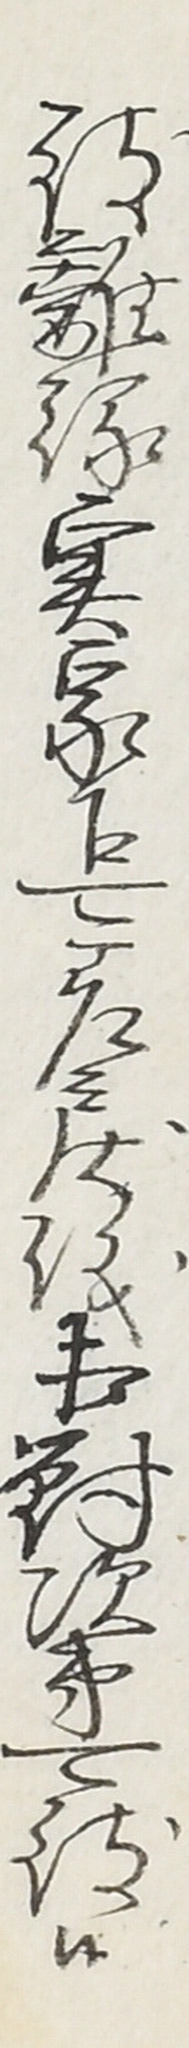致離縁実家江可差戻儀相対次第可致候
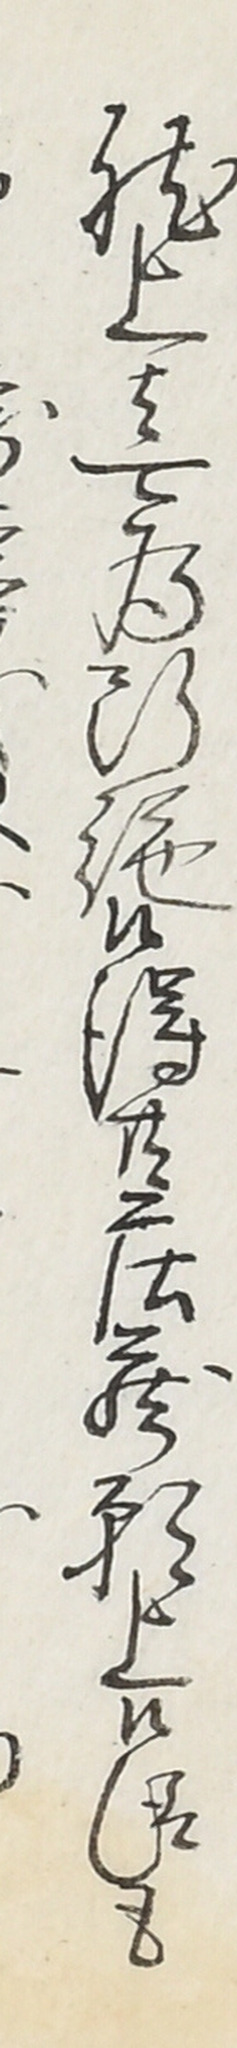然上は可為断絶候得共庄蔵願上候趣も
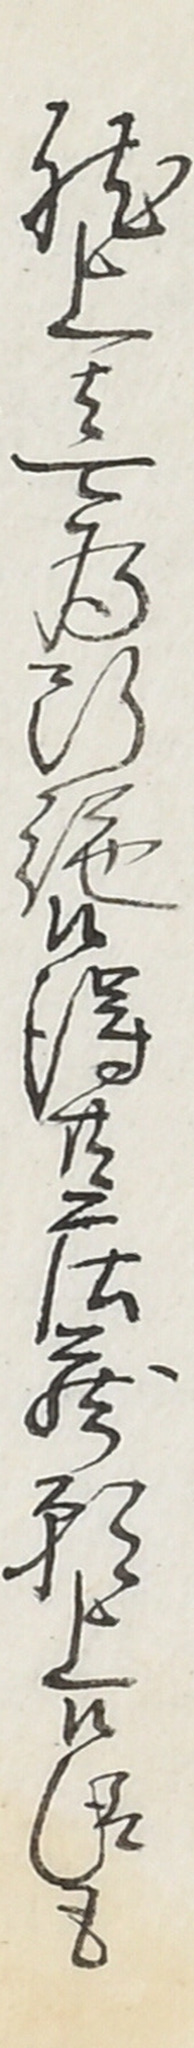然上は可為断絶候得共庄蔵願上候趣も
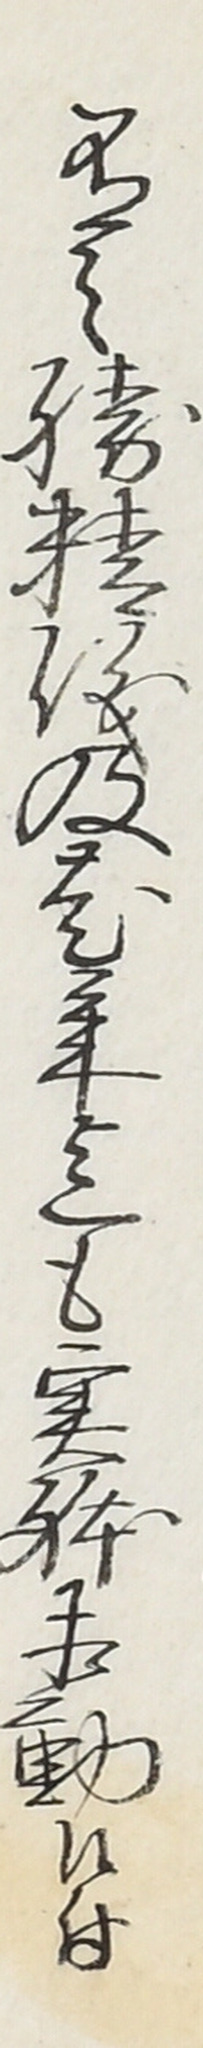有之勝精儀及老年迄も実躰相勤候付
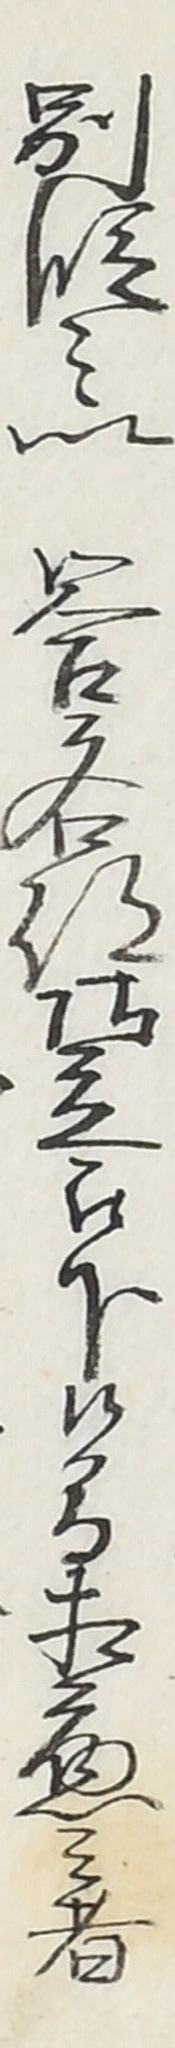別段之以思召名跡御立被下候間相応之者
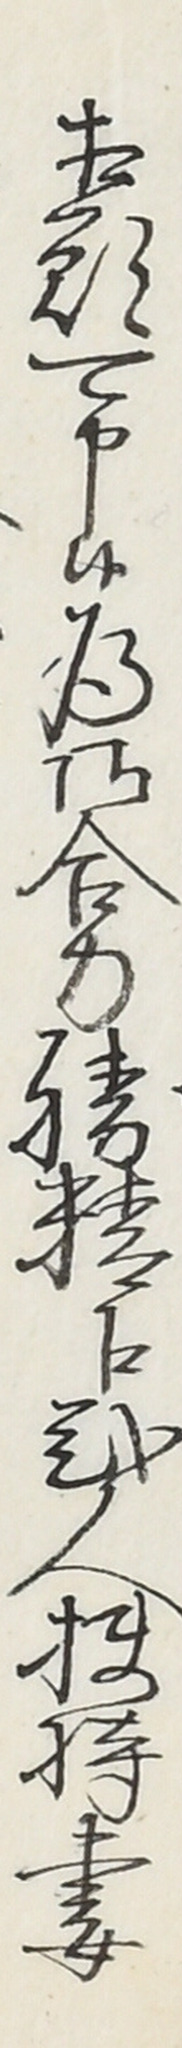相願可申候為御合力勝精江弐人扶持妻
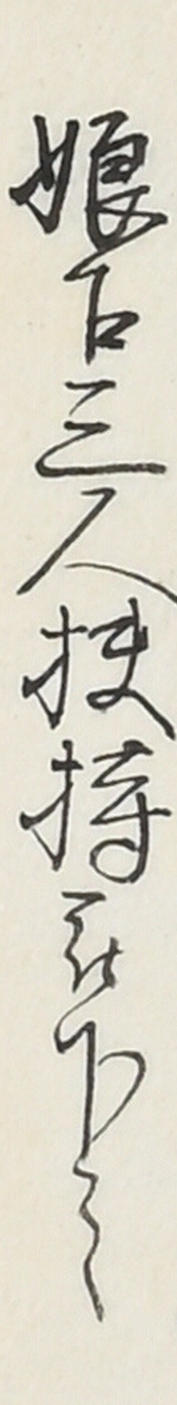娘江三人扶持被下之

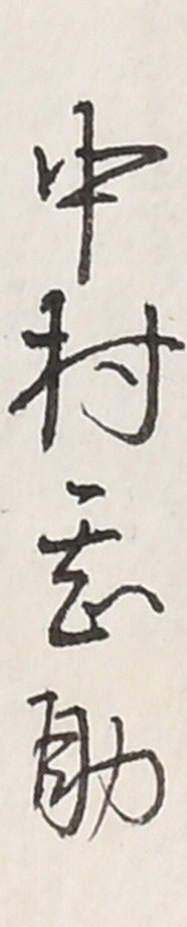中村甚助
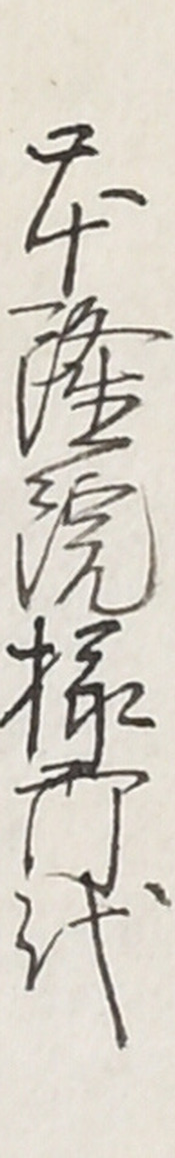本隆院様御代
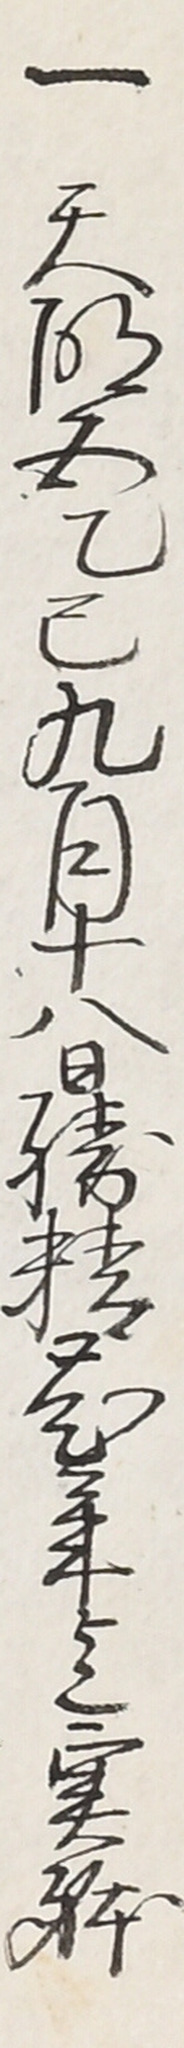一天明五乙巳九月十八日勝精老年迄実躰
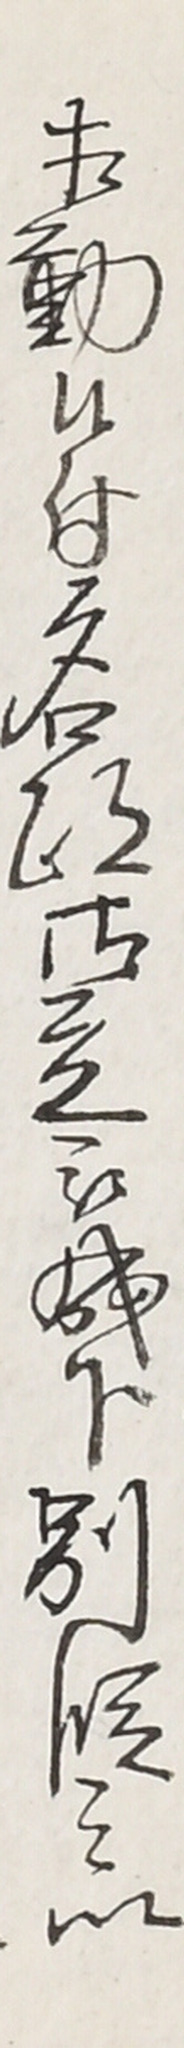相勤候付名跡御定被成下別段之以
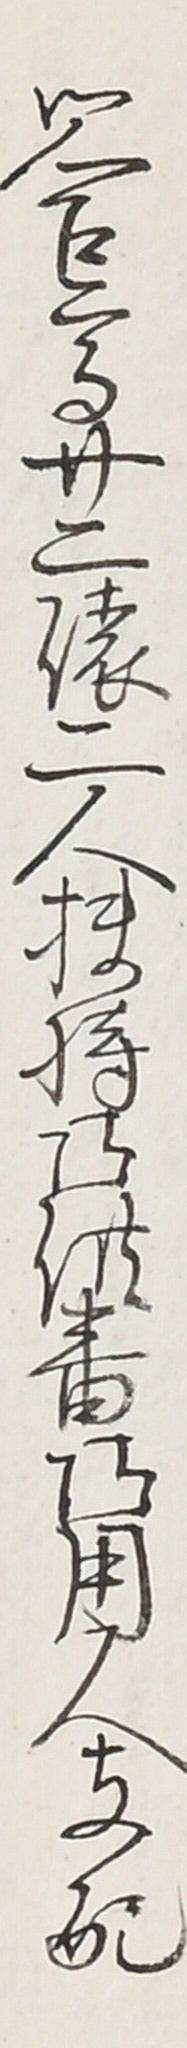思召高廿ｎ二俵二人扶持御供番御用人支配
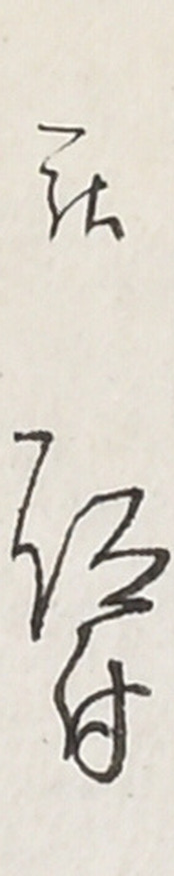被仰付
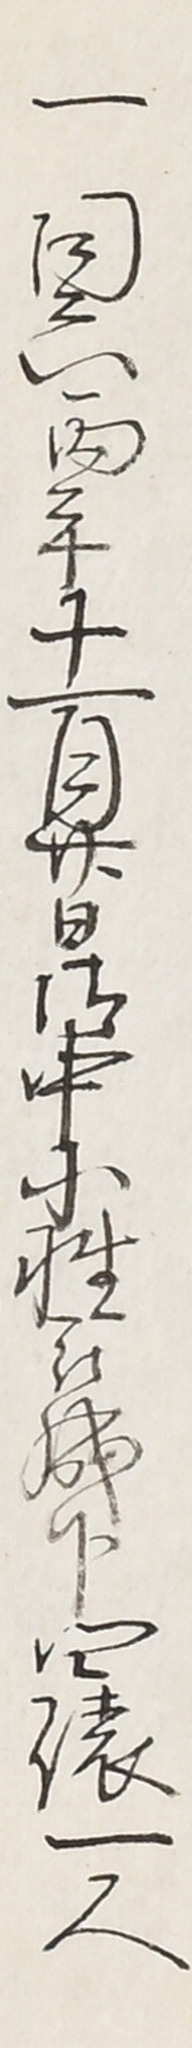一同六丙午十一月廿日御中小性被成下四俵一人
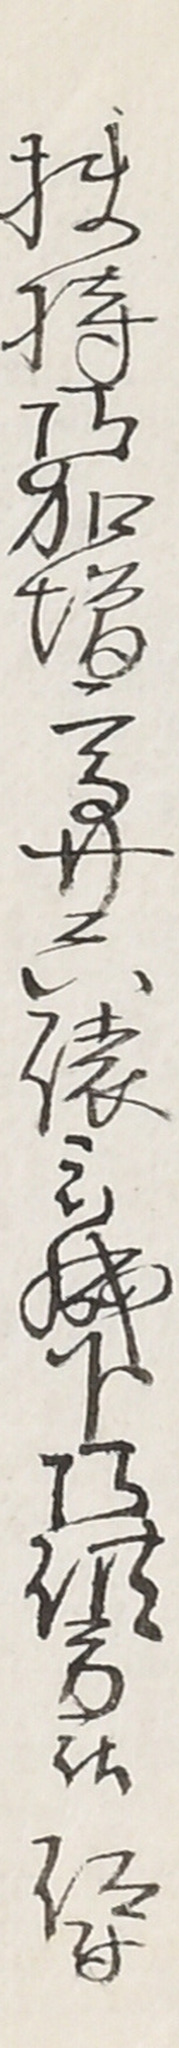扶持御加増高廿六俵被成下御供方被仰付
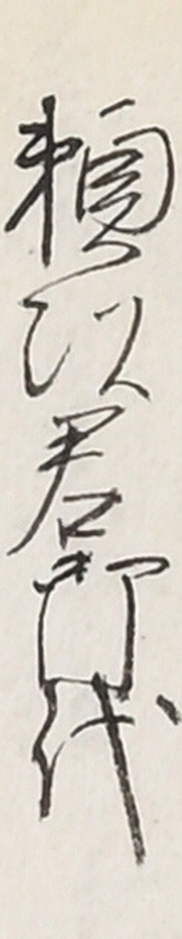頼寧君御代
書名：給人諸士勤仕録（七）
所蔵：伊那市立高遠町図書館・合同会社AMANE
